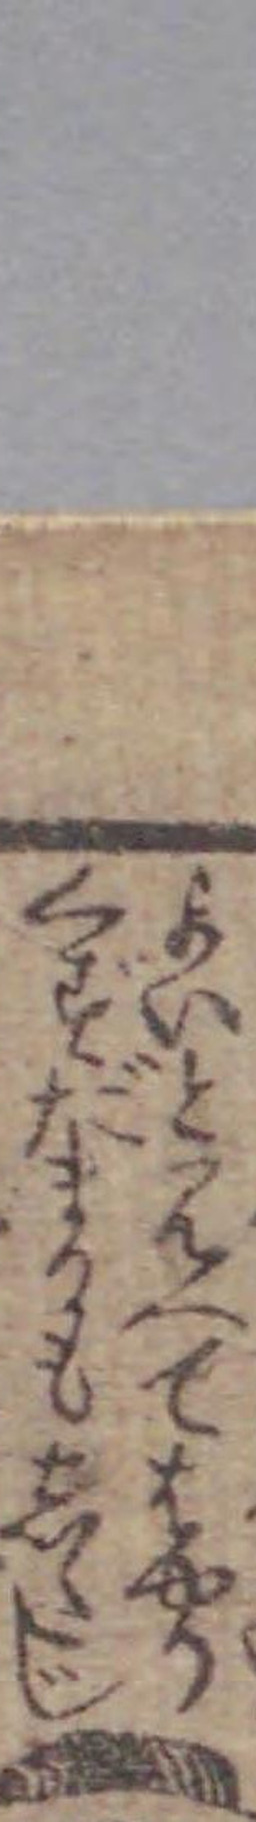くずだまりもしたじ
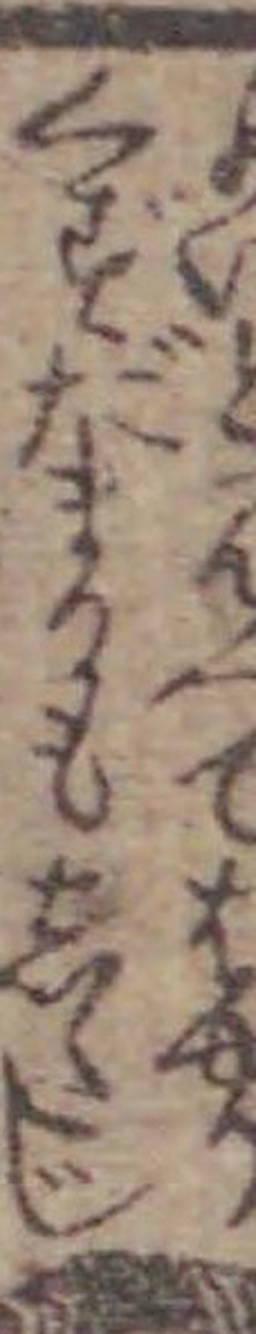くずだまりもしたじ
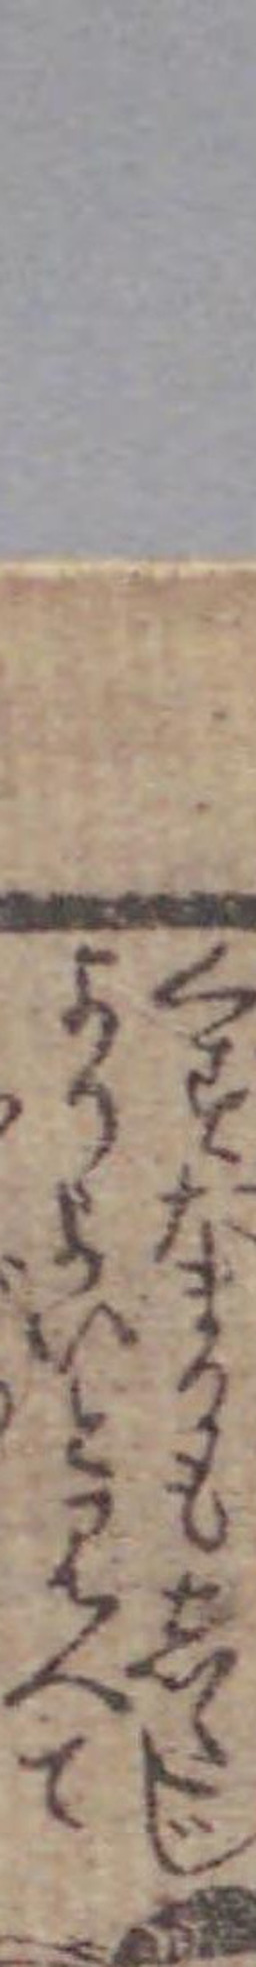よりよいとみへて
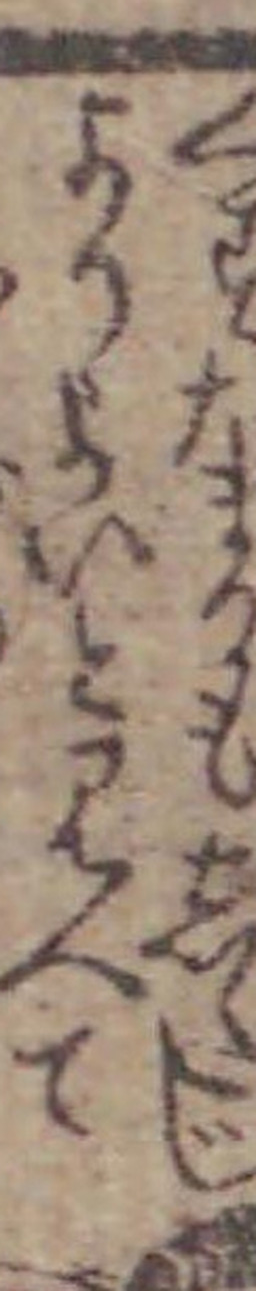よりよいとみへて
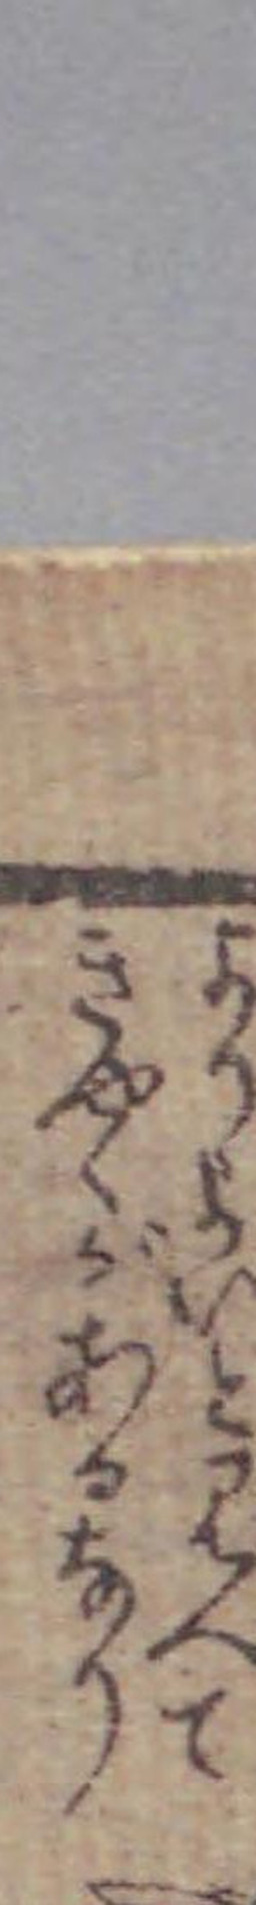きやくがあるなり
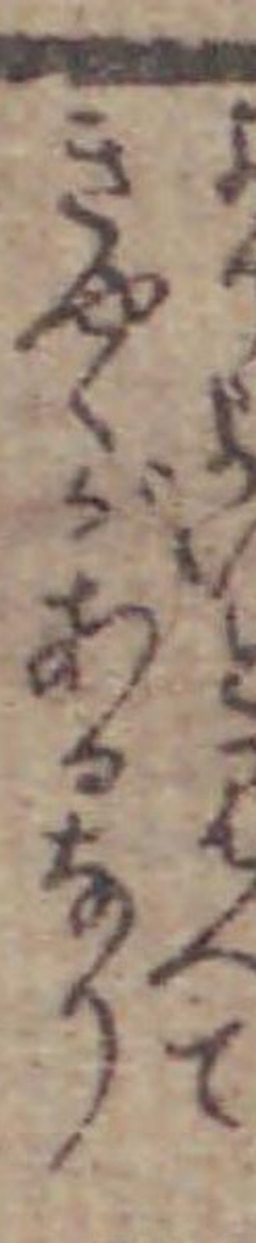きやくがあるなり

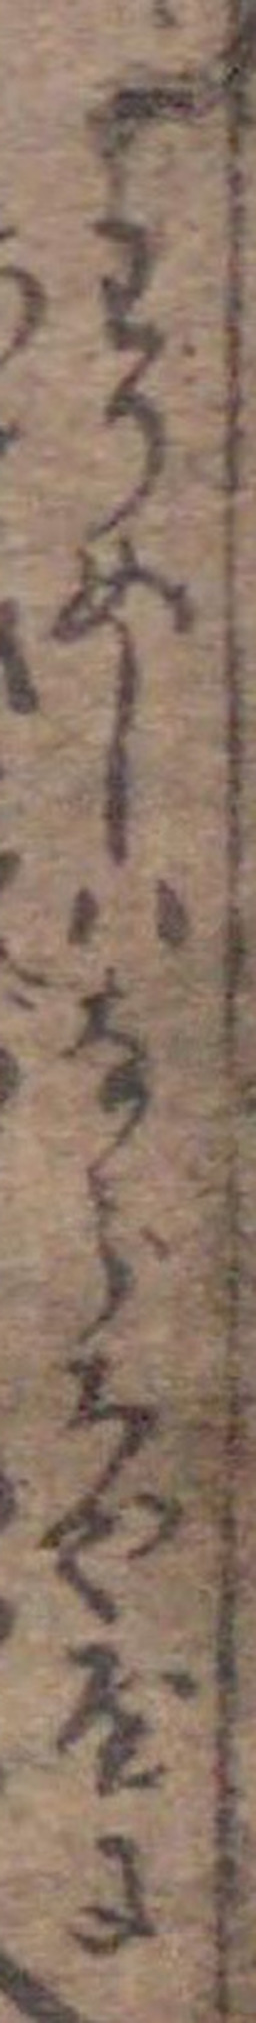わりめしはならちや屋に
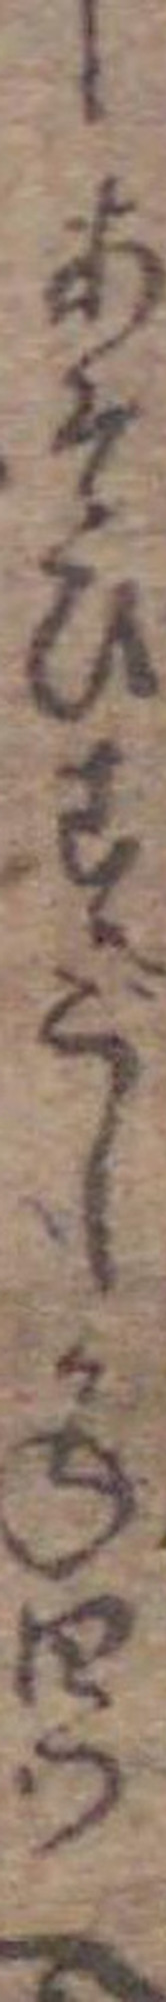あそひすごしかね四ツ
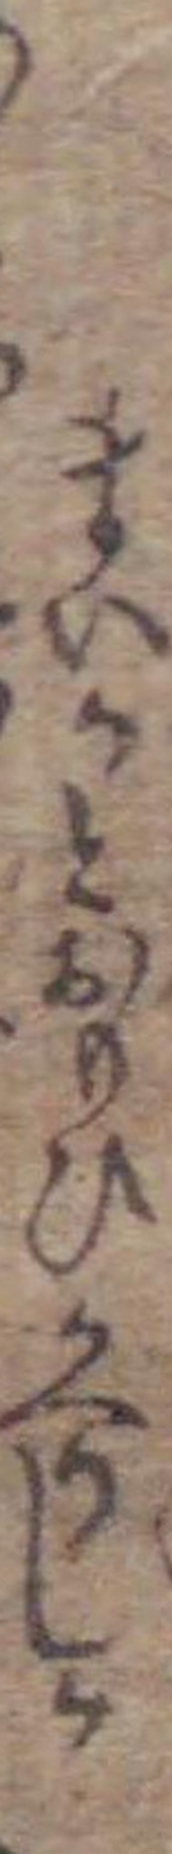まいかとおもひかへりしか
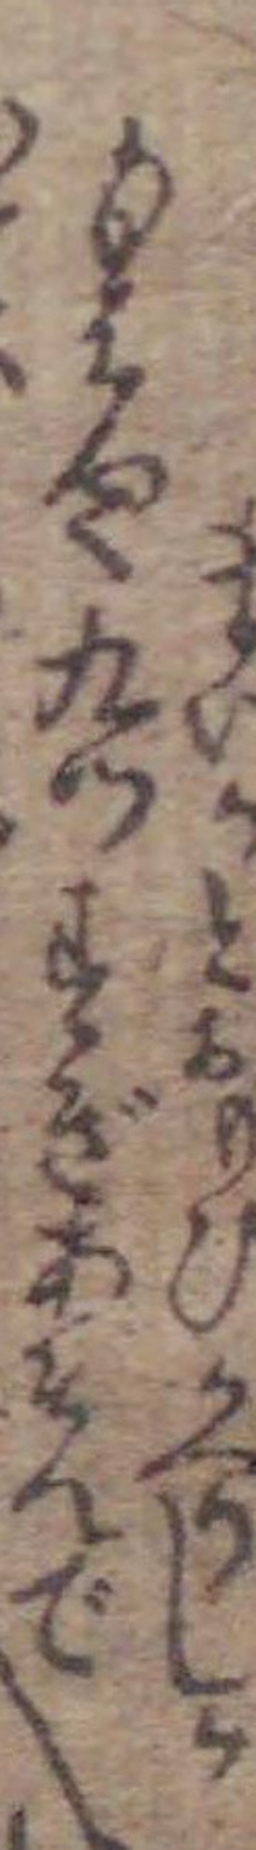もはや九ツすぎあそんで
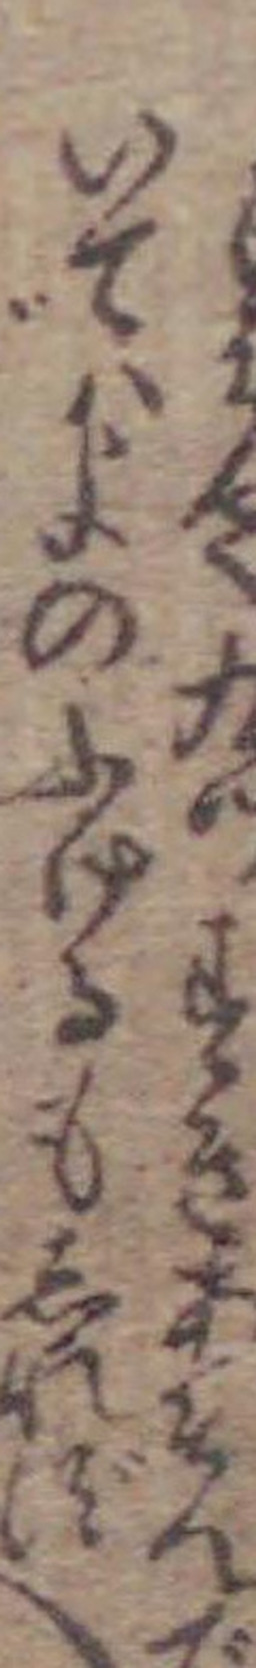いてはよのふけるもしれず
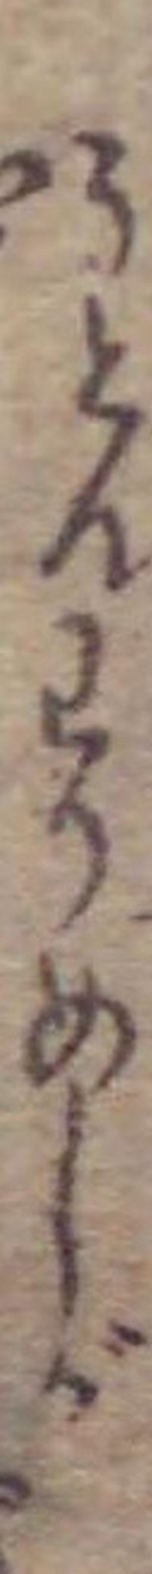うどんわりめしが
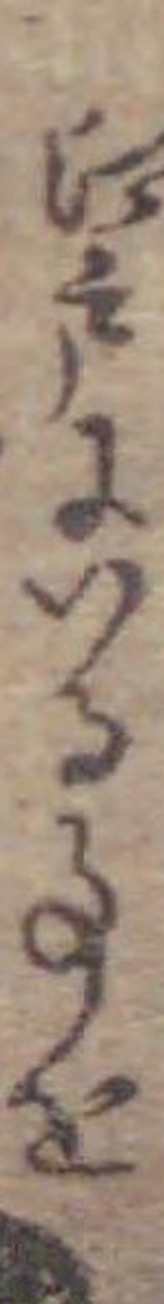江戸にいる事を
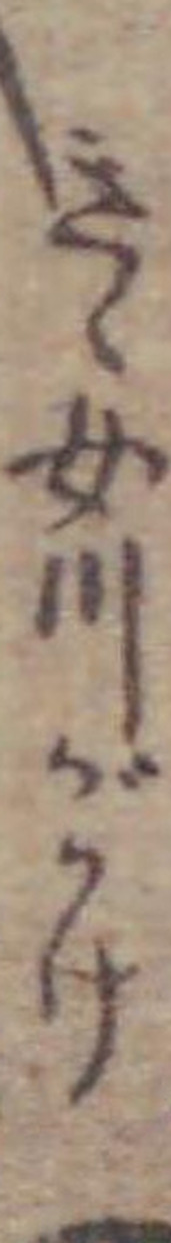きゝ女川がかけ
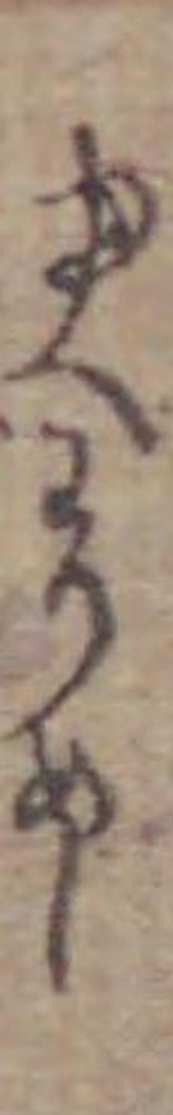ゆへわりめし
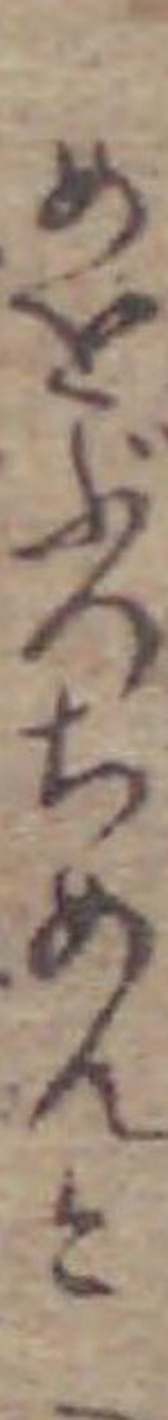めをぶつちめんと
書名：諸事米の飯 : 3巻
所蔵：国立国会図書館 National Diet Library, JAPAN
